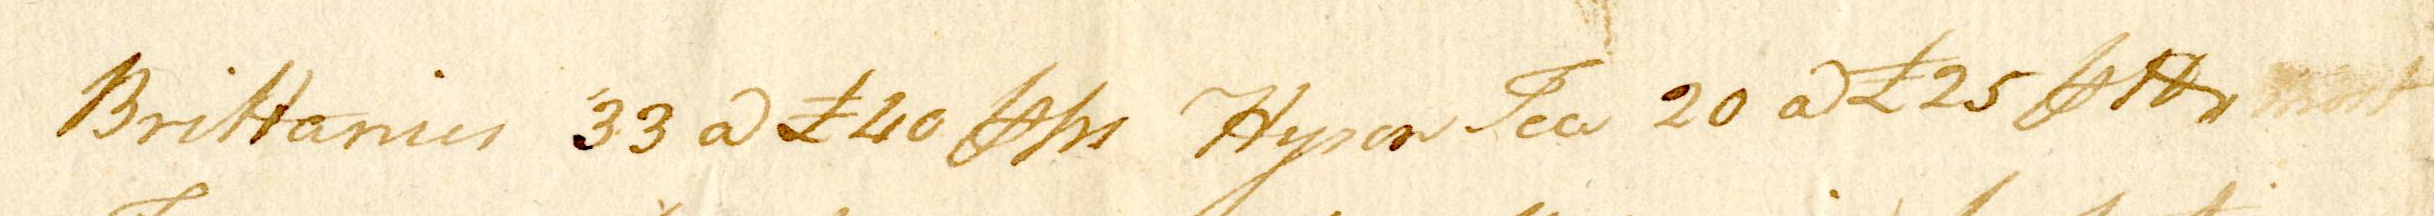Brittanies 33 a £40 per Hyra Tea 20 a £25 per lb
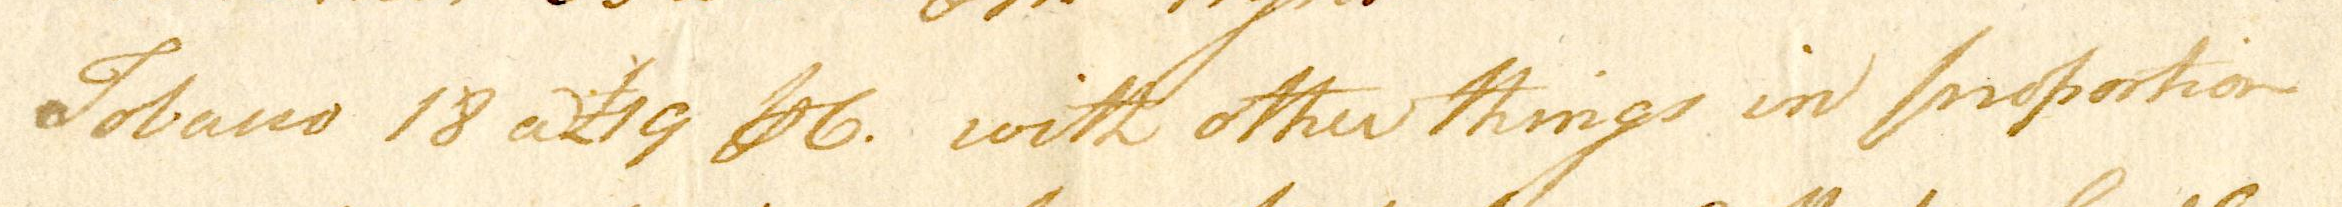tobacco 18 @ £9 per 6. with other things in proportion
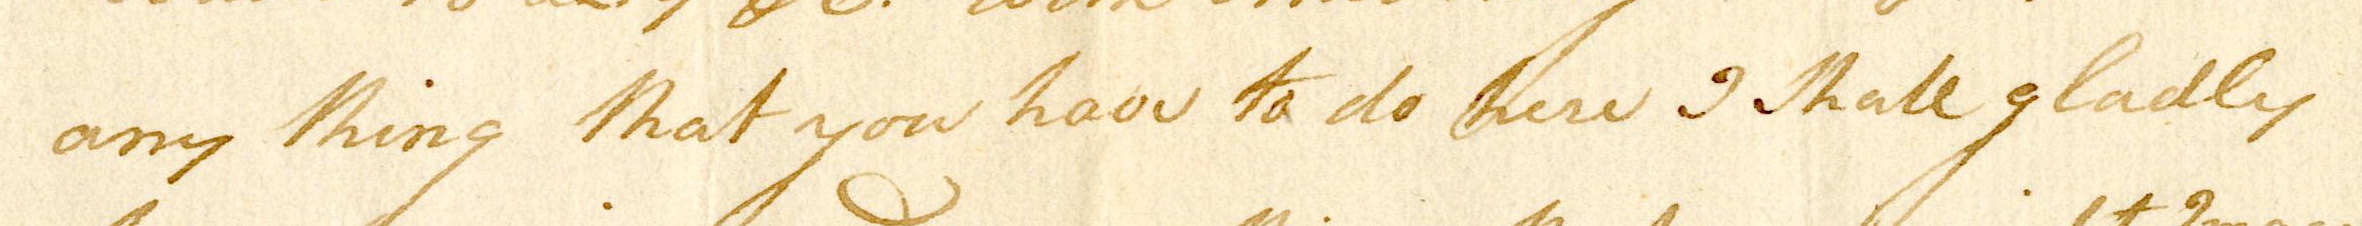any thing that you have to do here I shall gladly
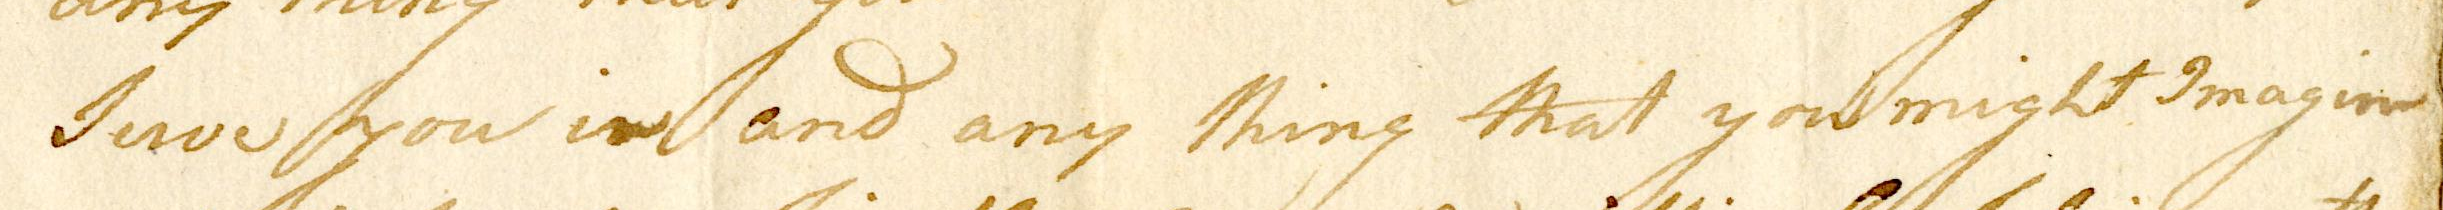serve you in and any thing that you might imagine
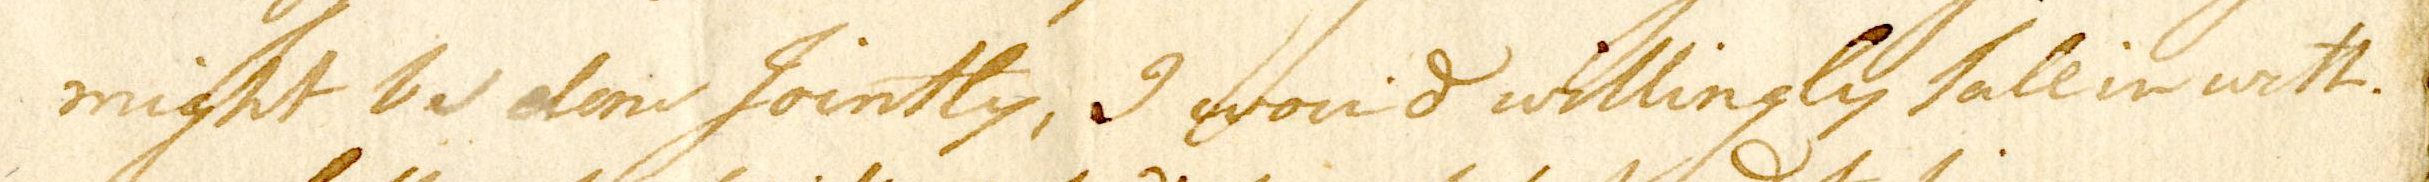might be along jointly, I wou'd willingly take in with
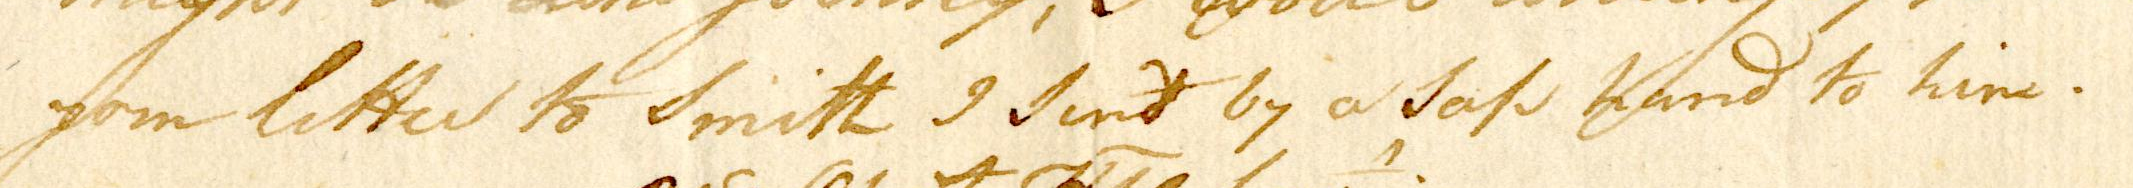your letter to Smith I send by a safe hand to him.
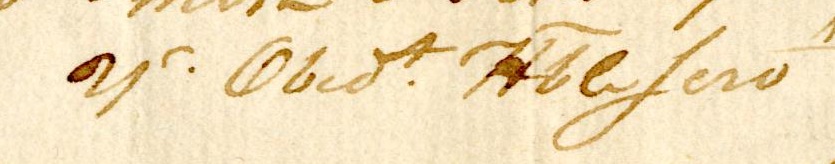Y^r. Old^st. Hbl serv^t.
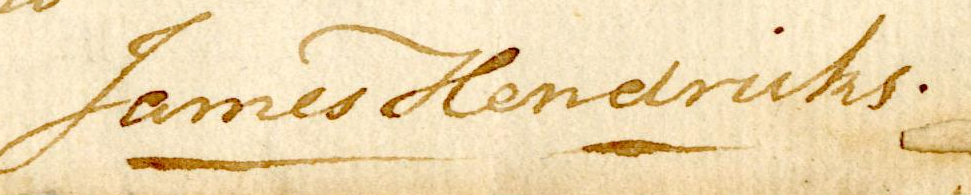James Hendricks.
